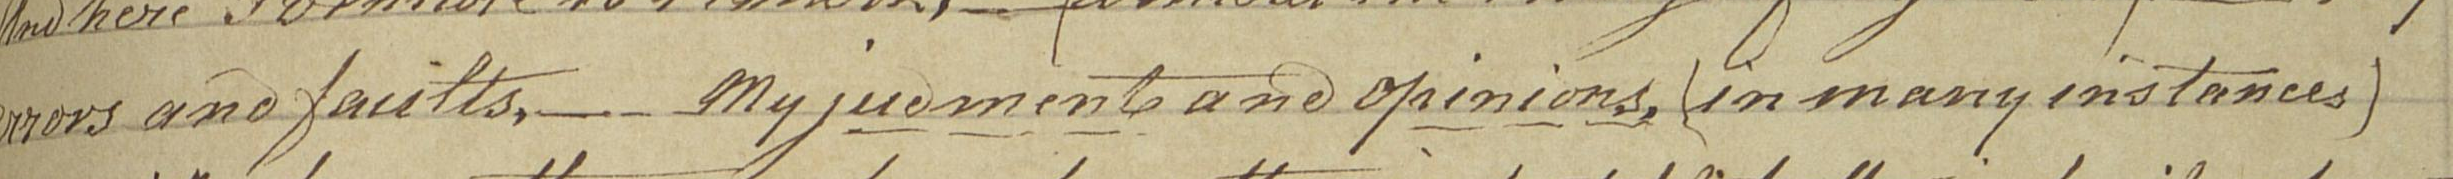errors and faults, My judment and opinions, (in many instances)
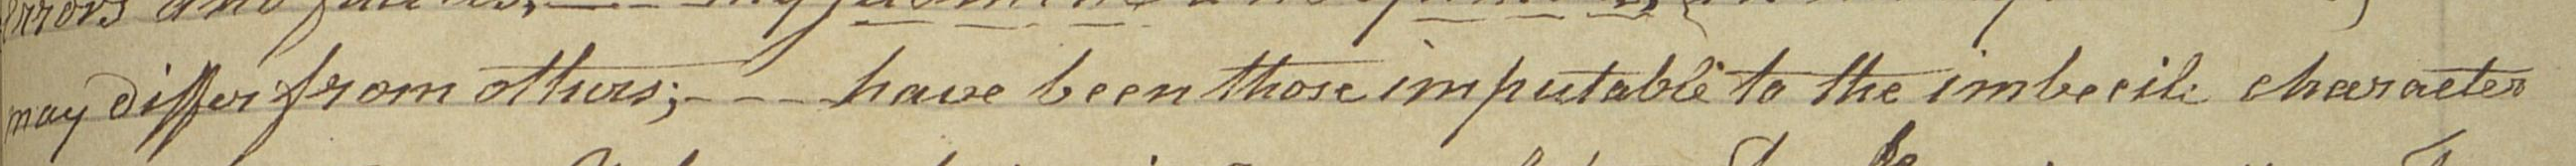may differ f rom others; have been those imputable to the imbecile character
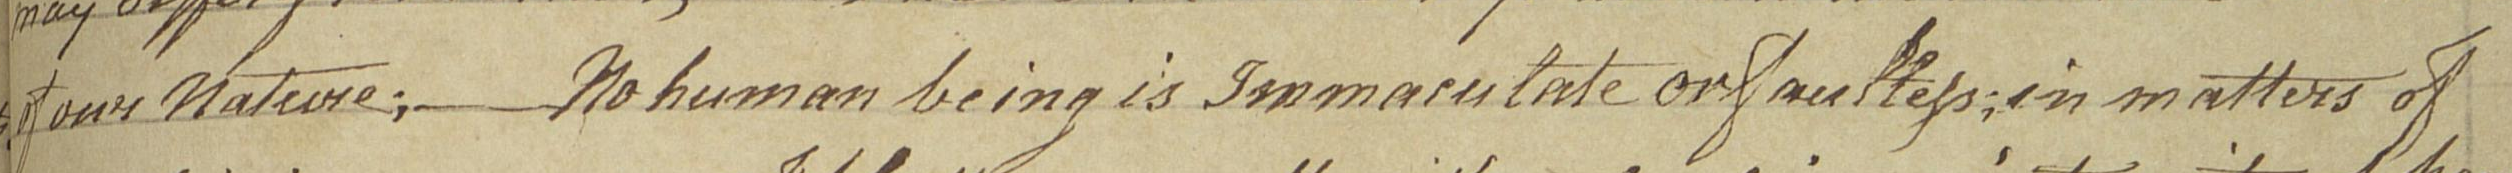-t our Nature; No human being is Immaculate or faultess; in matters of
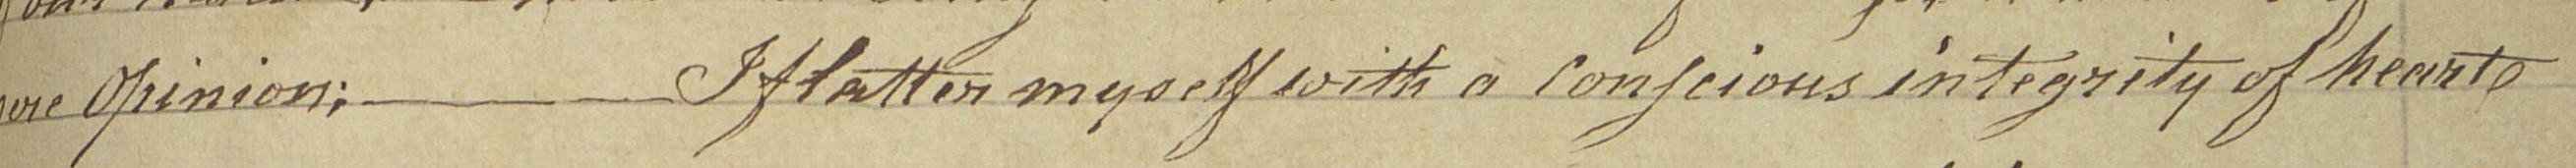more Opinion; If latter myself with a conscious integrity of hearto
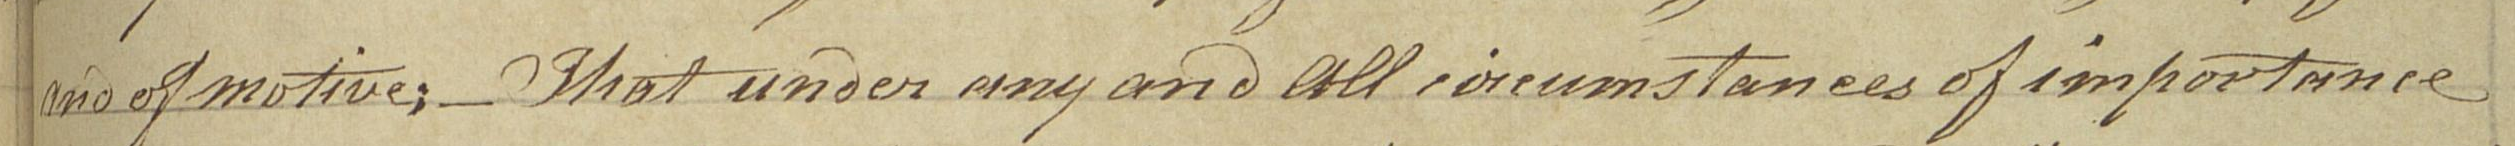and of motive; That under any and All circumstances of importance
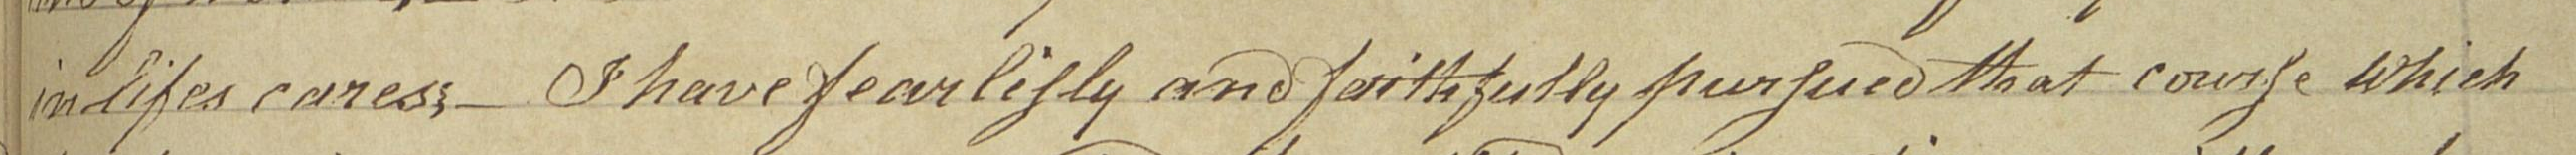in lifes cares; I have fearlesly and faithfully pursued that course Which
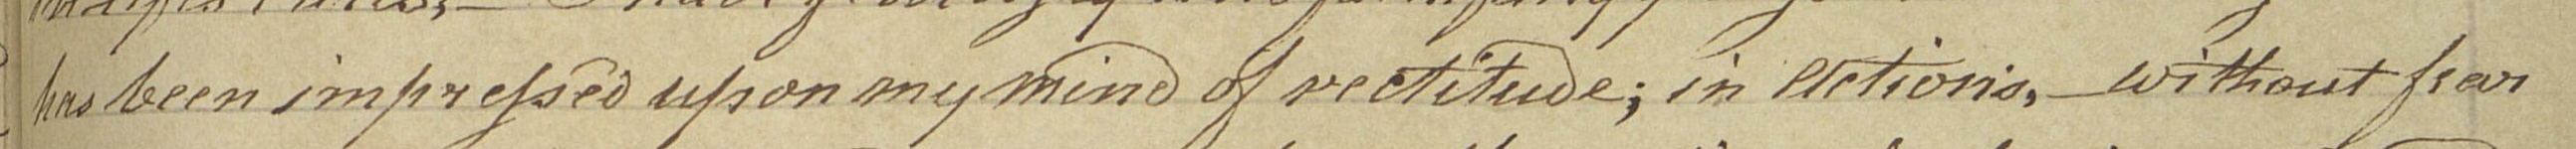has been impressed upon my mind of rectitude; in Action's, without fear
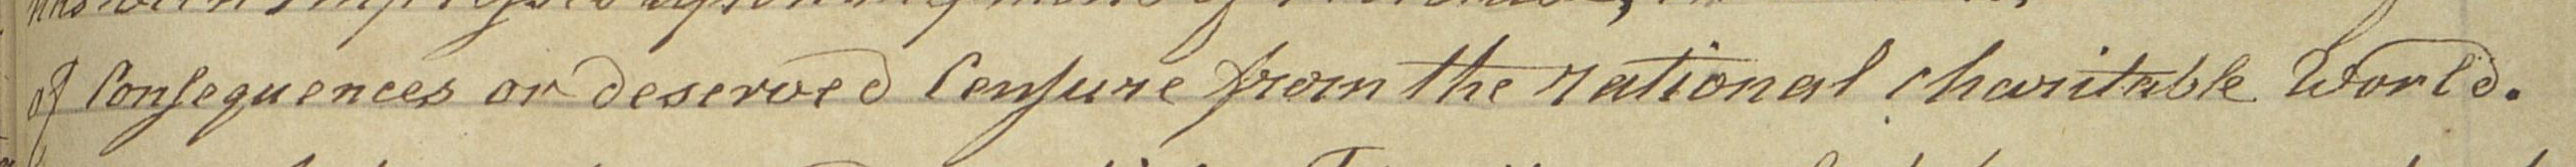of Consequences or deserved Censure from the rational charitable world.
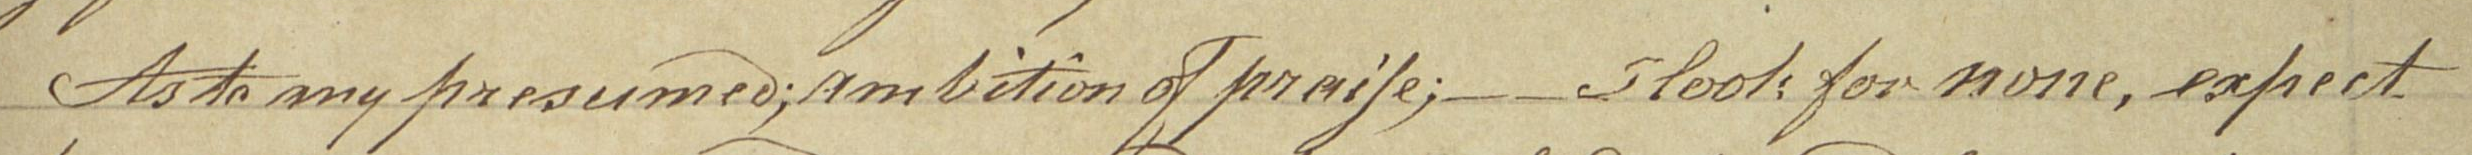As to my presumed; ambition of praise; I look for none, expect
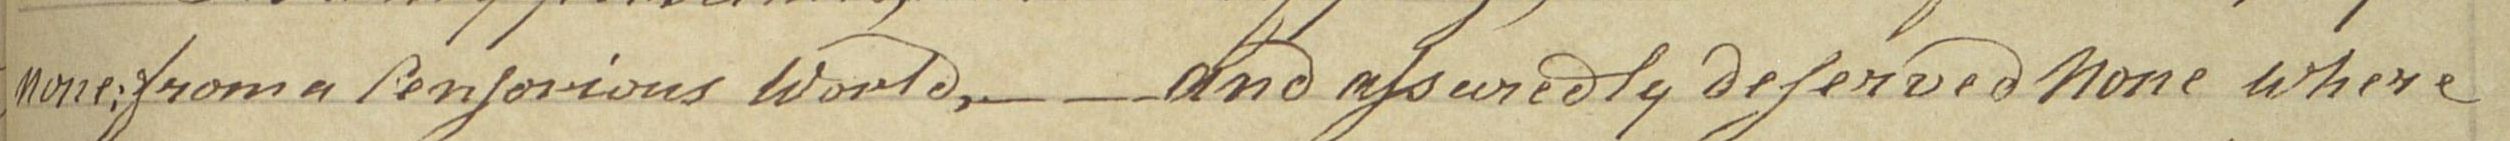more: from a Censorious World, and assuredly deserved none where
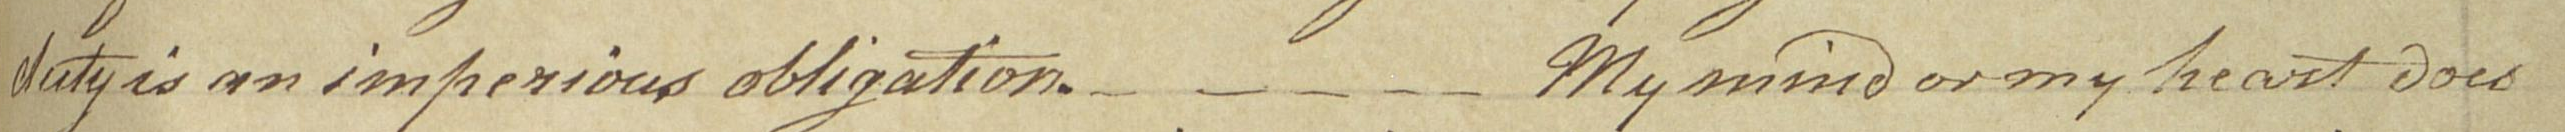duty is on imperious obligation. My mind or my heart does
